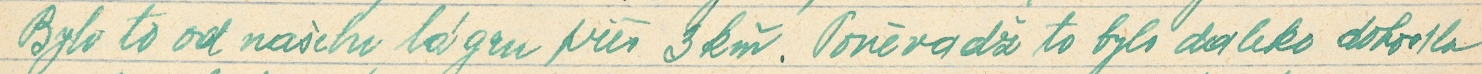Bylo to od našeho lágru přes 3 km. Poněvadž to bylo daleko dohodla
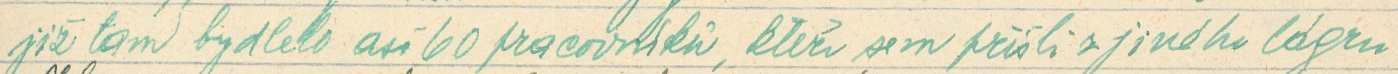již tam bydlelo asi 60 pracovníků, kteří sem přišli z jiného lágru
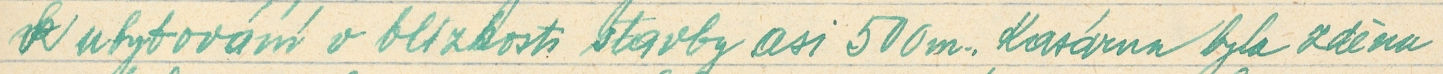k ubytování v blízkosti stavby asi 500 m. Kasárna byla zděná
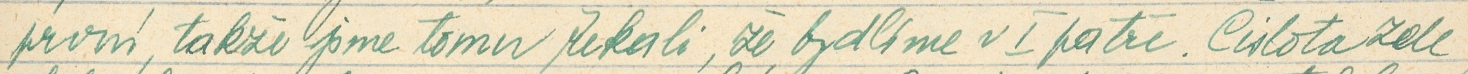první, takže jsme tomu řekali, že bydlíme v I patře. Čistota zde
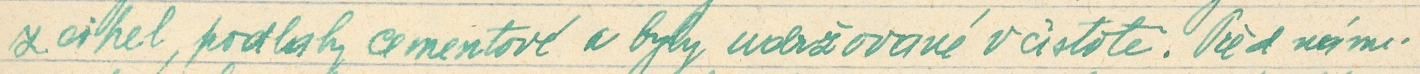z cihel, podlahy cementové a byly udržované v čistotě. Před námi
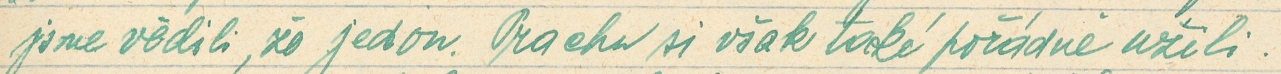jsme vědili, že jedou. Prachu si však také pořádně užili.
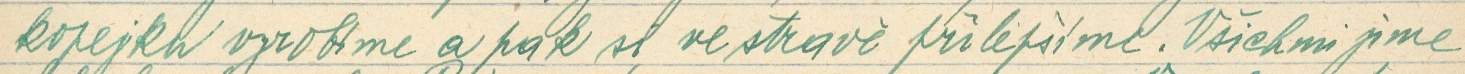kopejku vyrobíme a pak si ve stravě přilepšíme. Všichni jsme
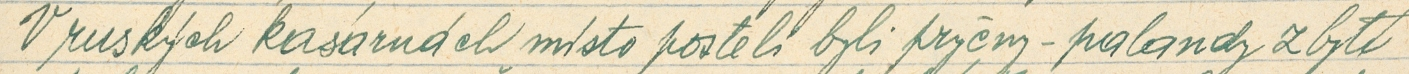V ruských kasárnách místo postelí byli pryčny - palandy zbyté
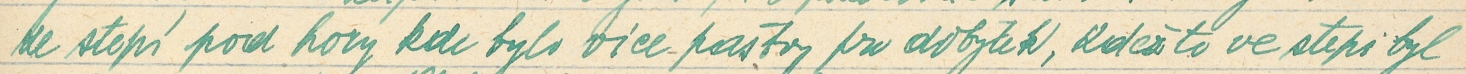ze stepí pod hory kde bylo více pastvy pro dobytek, kdežto ve stepi byl
